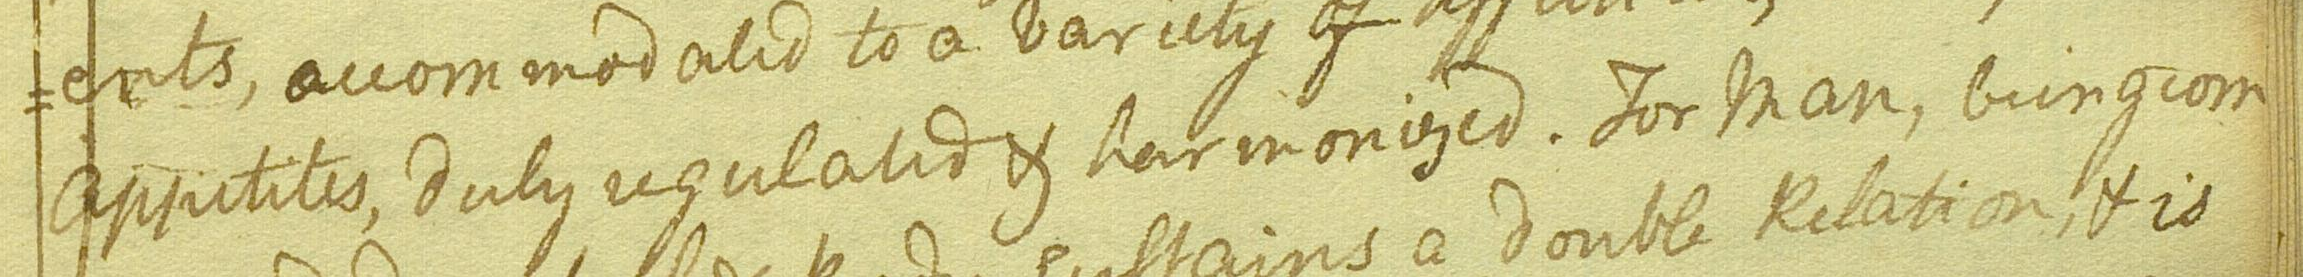Appetites, duly regulated & harmonized. For man, being com
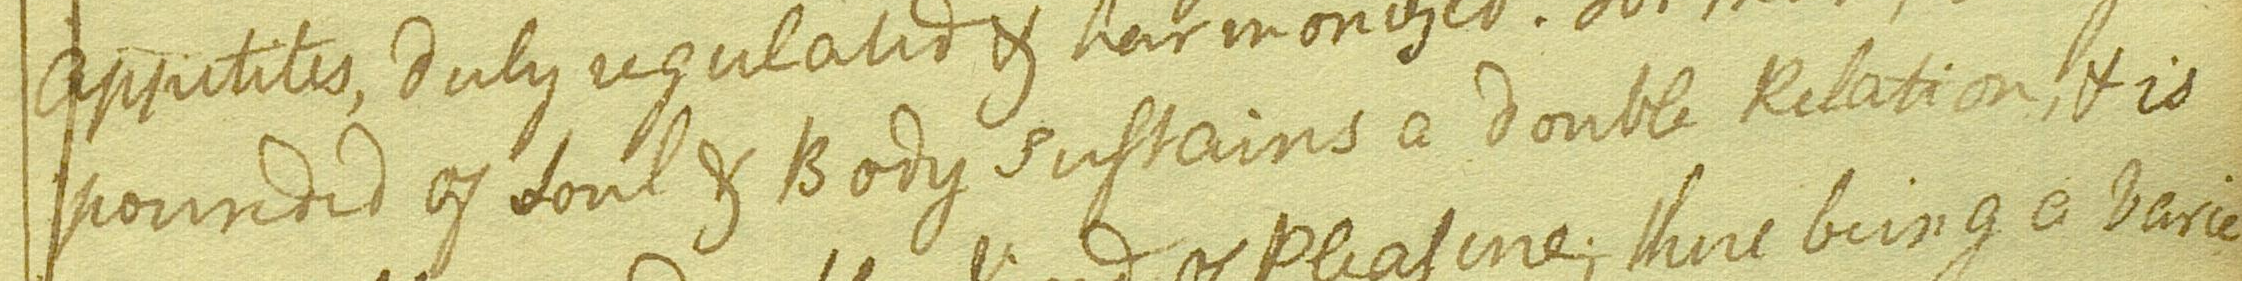pounded of Soul & Body sustains a double relation, & is
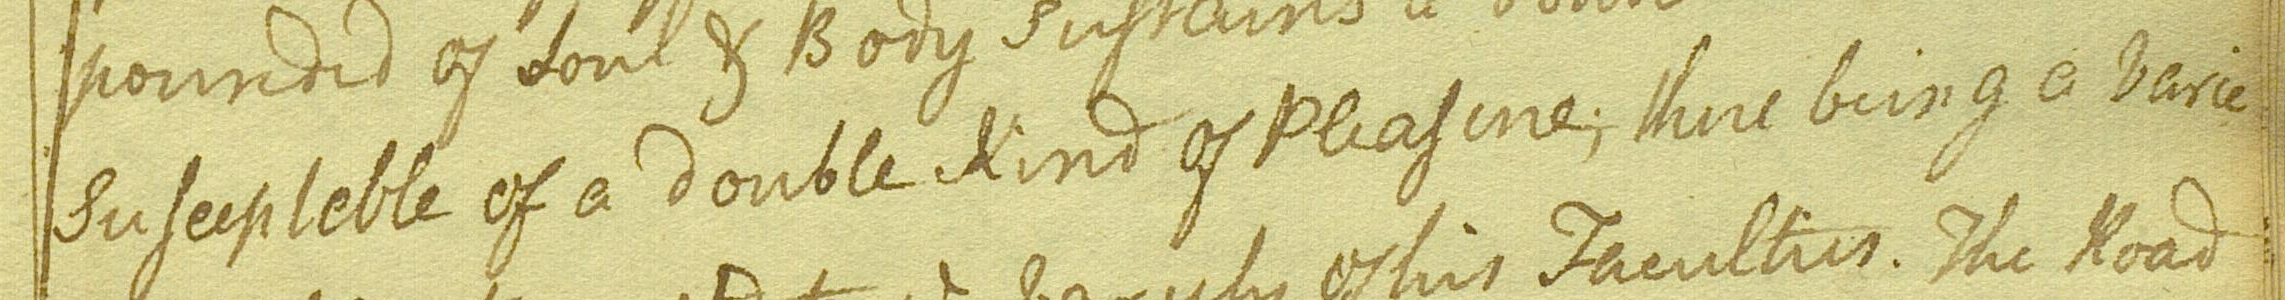susceptable of a double kind of Pleasure; there being a varie-
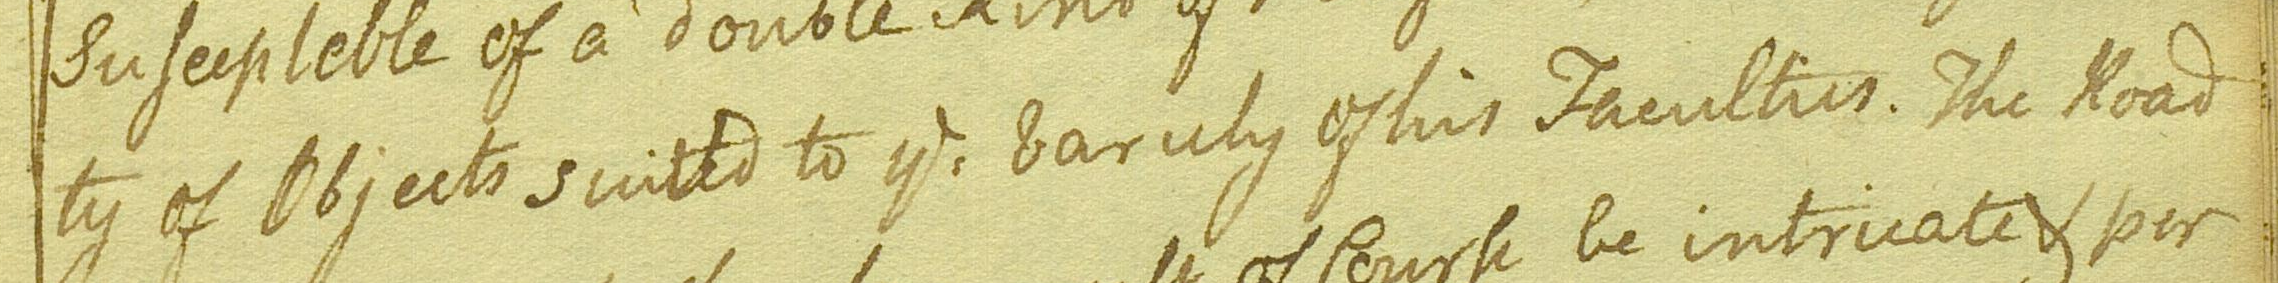ty of Objects suited to y^e. variety of his Faculties. The Road
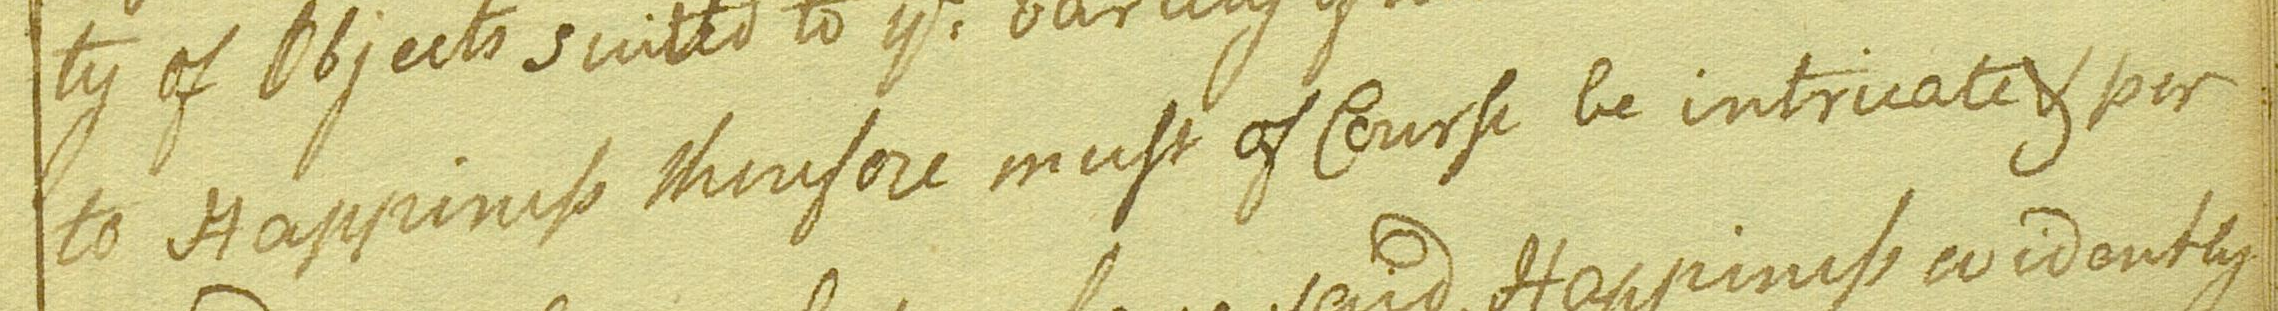to Happiness therefore must of course be intricate & per-
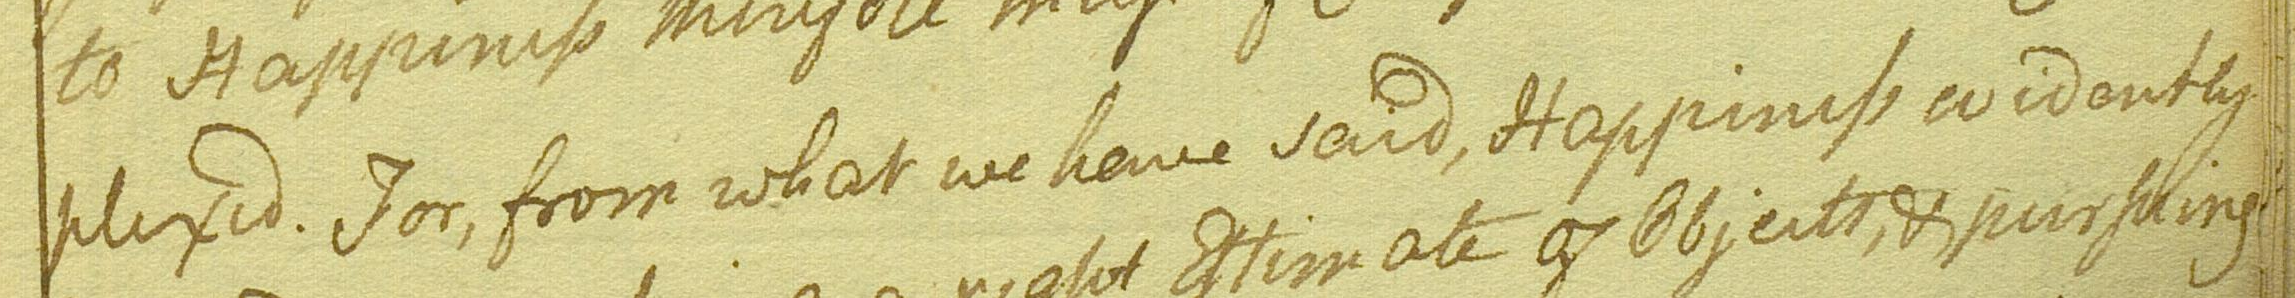plexed. For, from what we have said, Happiness evidently
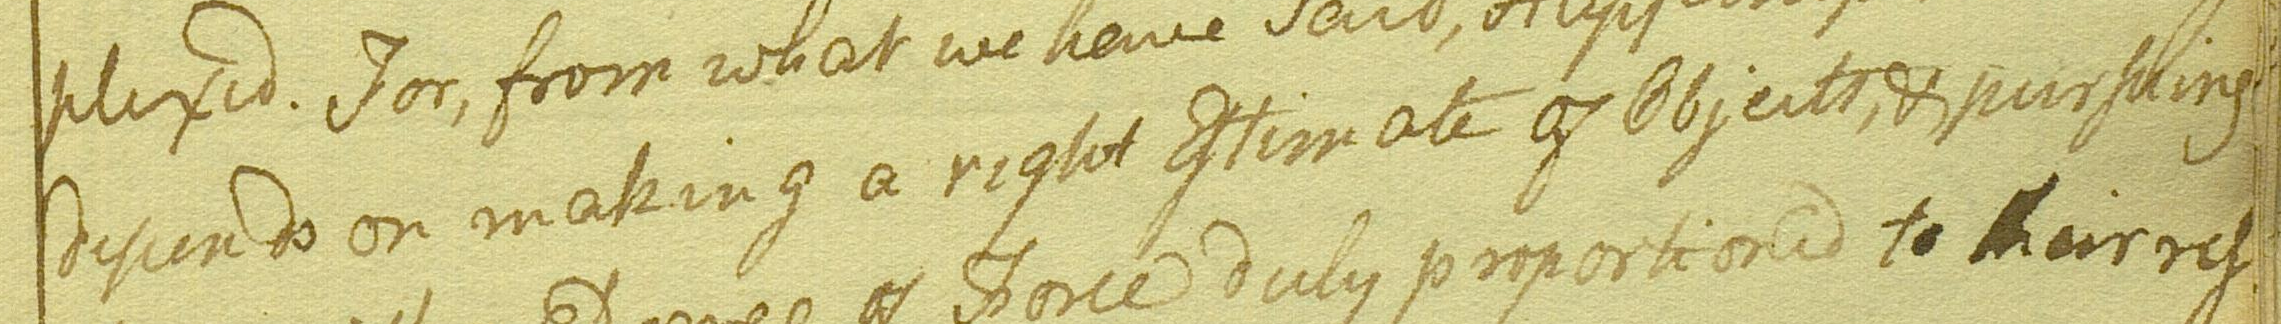depends on making a right Estimate of Objects & pursuing
